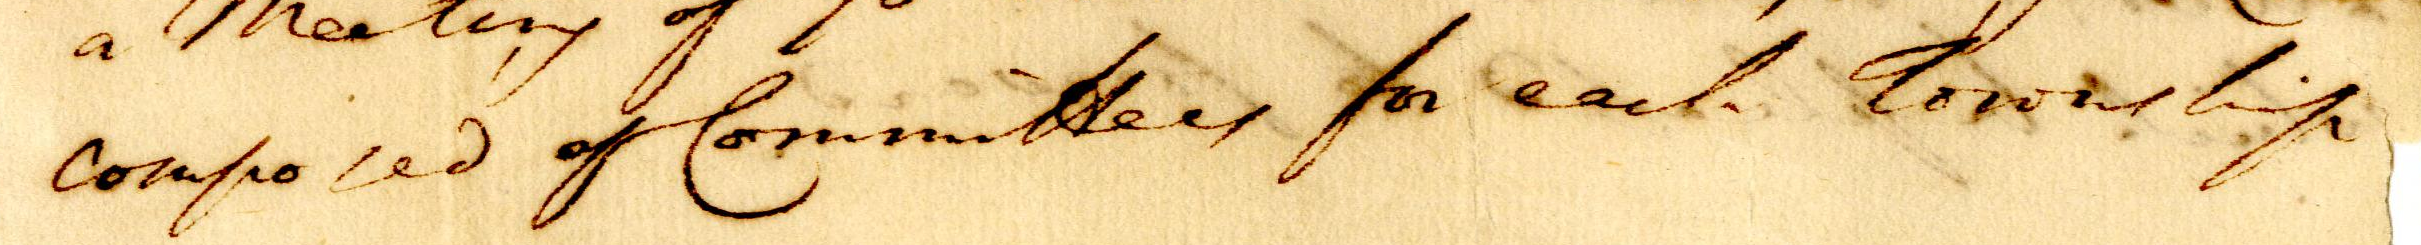composed of Committees for each Township
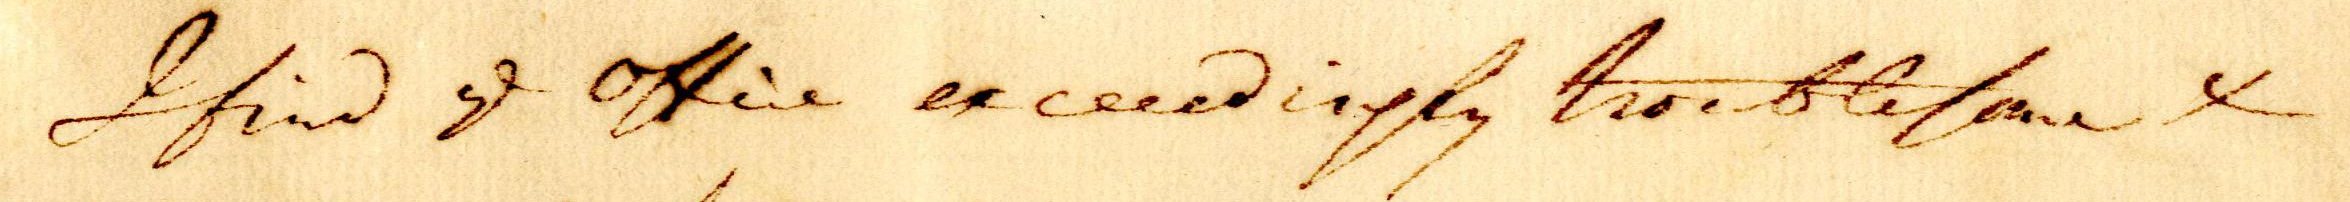I find y^e office exceedingly troublesome &
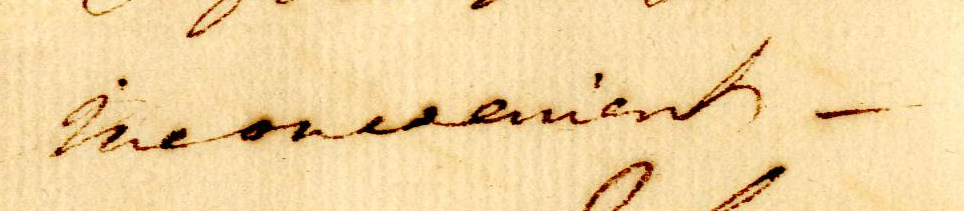inconveniant.
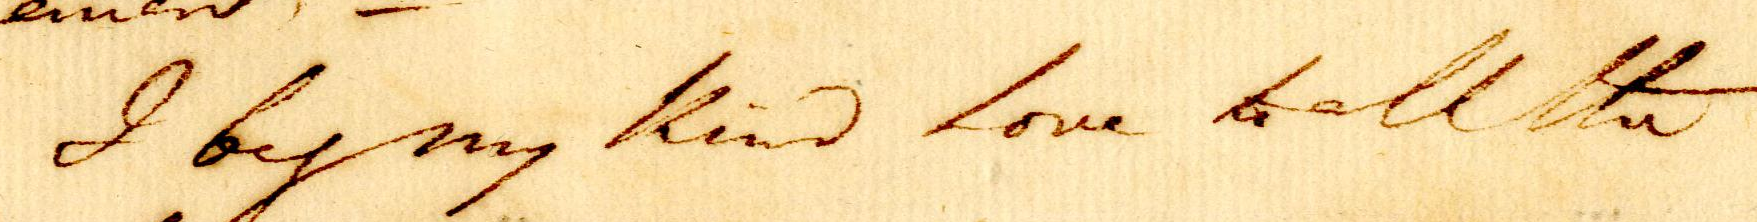I beg my Kind Love to all the
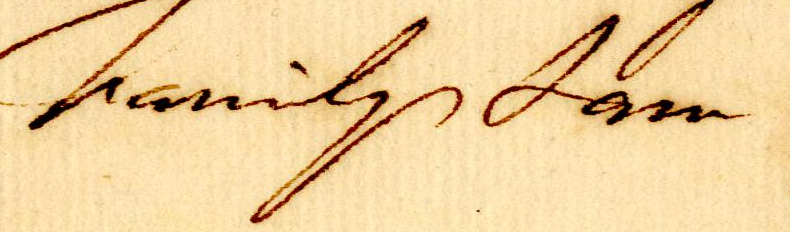Family I am
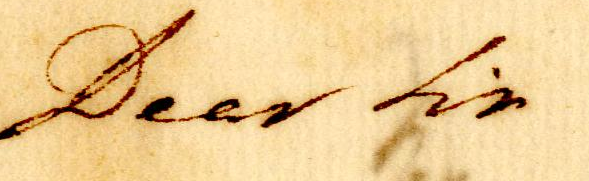Dear Sir
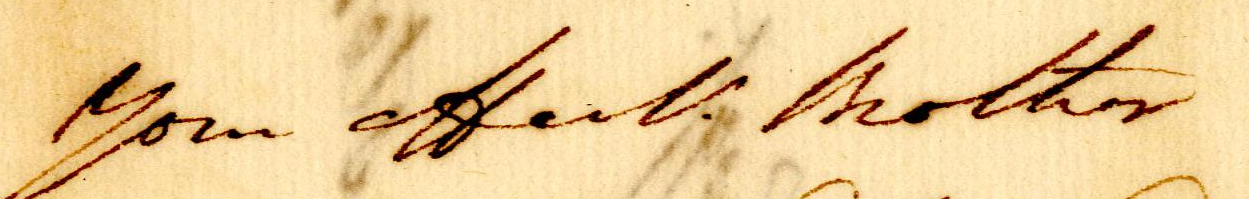Your affect. Brother
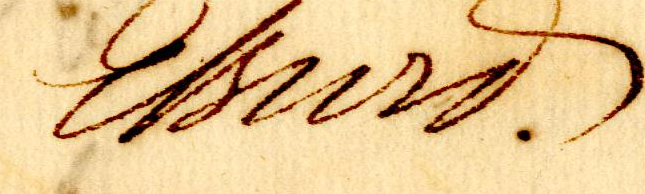E. Burd.
